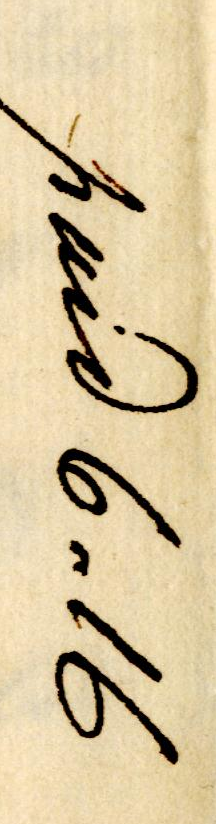paid 6.16
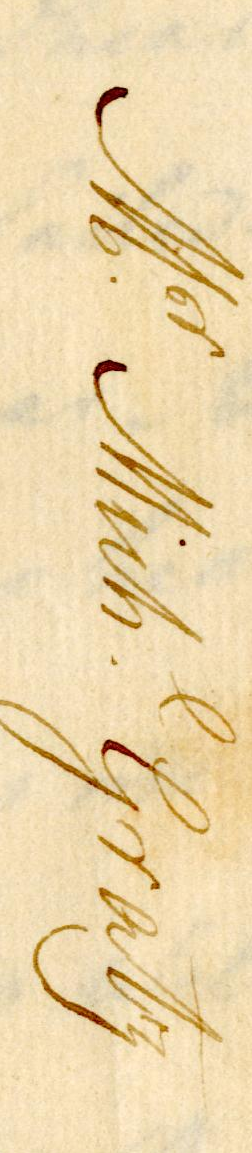M^r Mich^l. Gratz
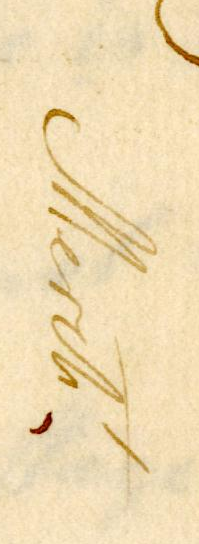Merct^t.
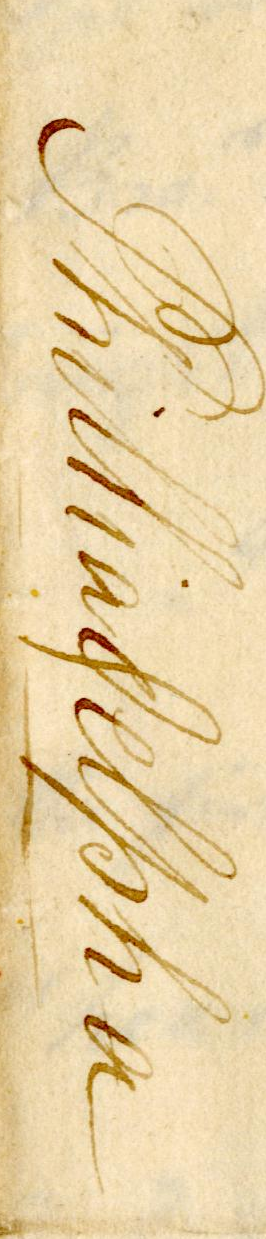Philliadelpha
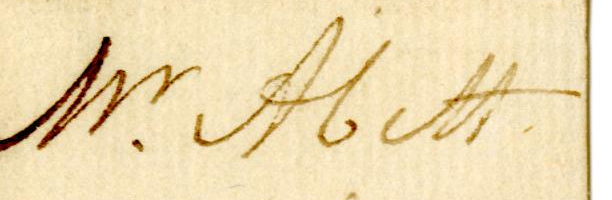M^r Abett
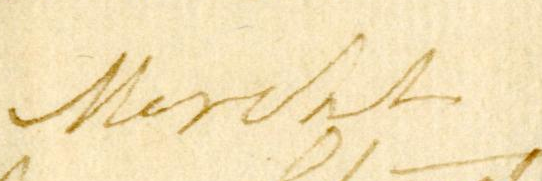Mercht
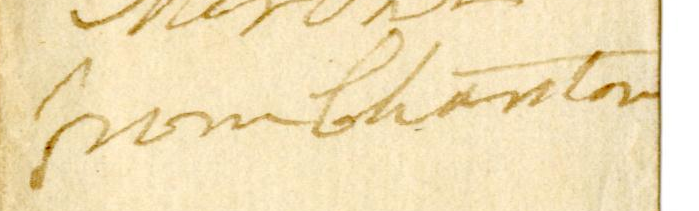from Chantor
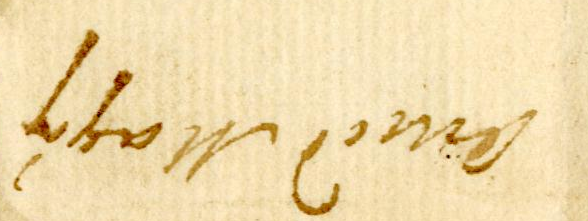answ^d May 7
